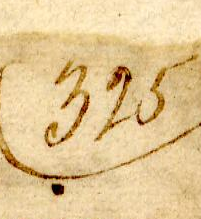325
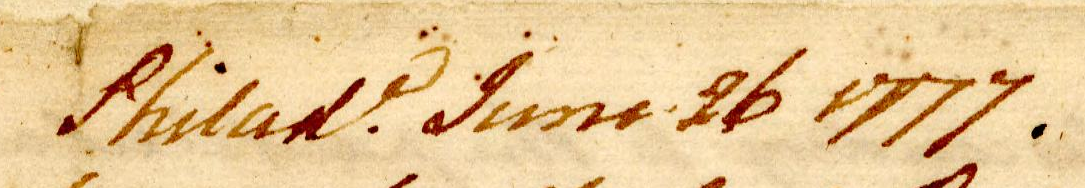Philad^a. June 26 1777.
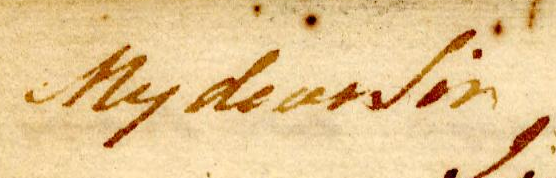My dear Sir
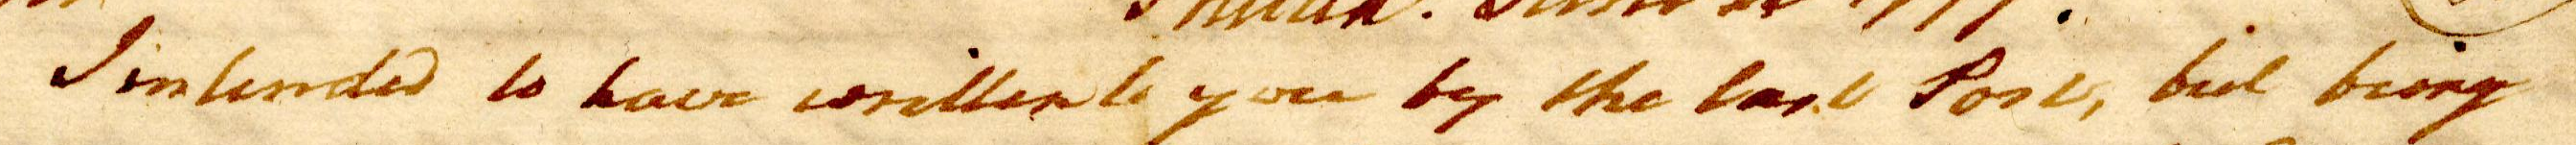I intended to have written you by the last Post, but being
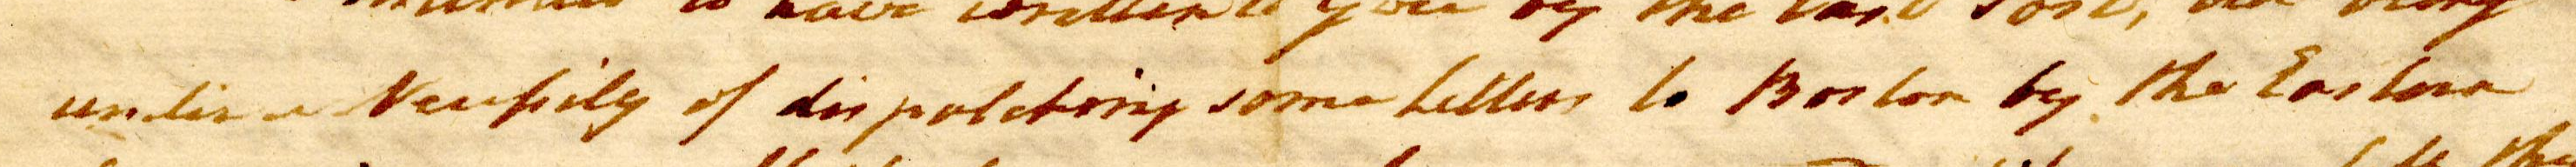under a necessity of dispatching some Letters to Boston by the Eastern
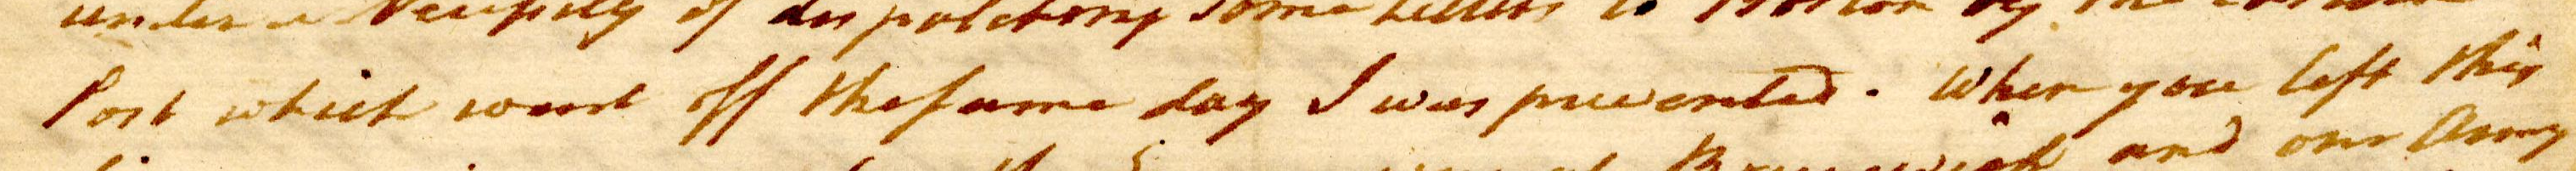Post which went off the same day I was prevented. When you left this
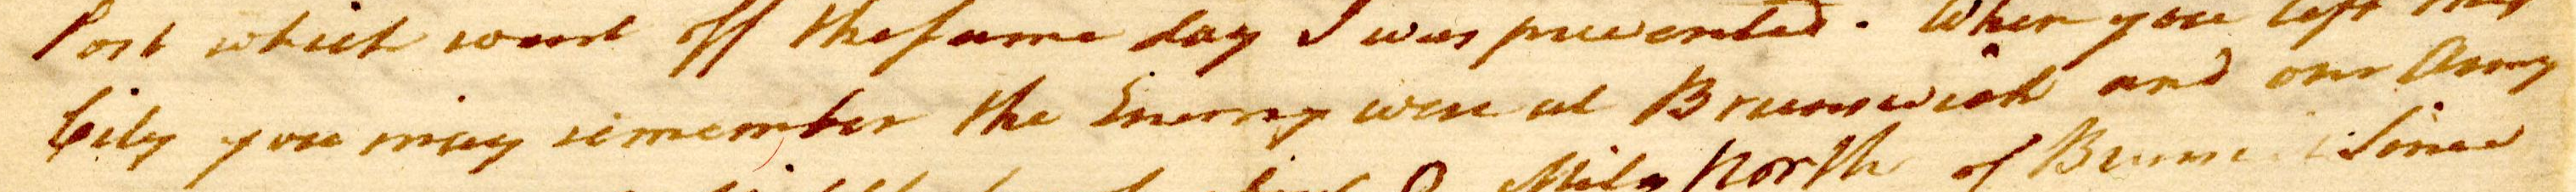City you may remember the Enemy were at Brunswick and our Army
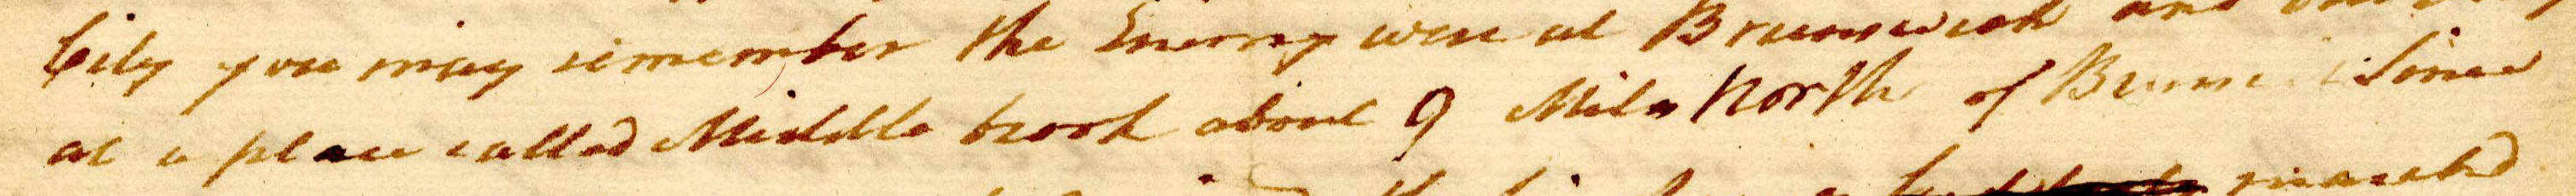at a place called Middle brook about 9 Miles North of Brunswick some
